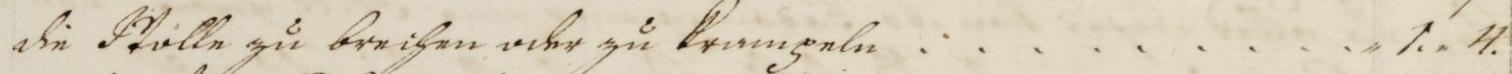die Wolle zu brechen oder zu krampeln........ 1. 4.
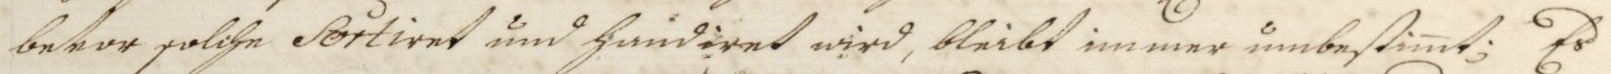bevor solche Sortiret und handiret wird, bleibt immer umbestimmt. Es
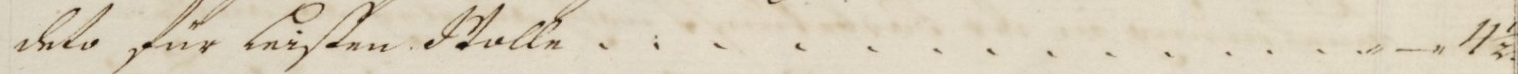deto für Leisten Wolle..... — 4 1/2.
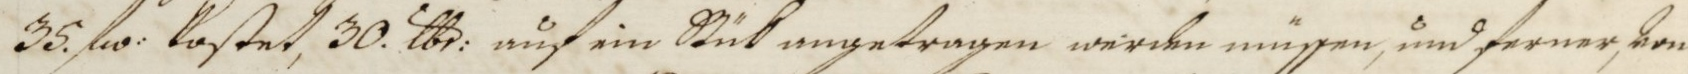35. fl. kostet, 30. lb. auf ein Stük angetragen werden müssen, und ferner, von
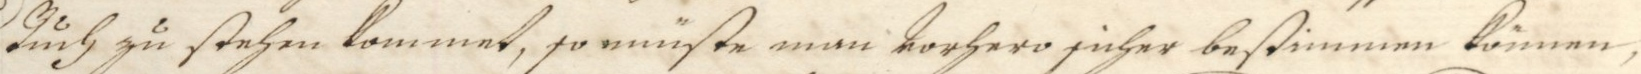Tuch zu stehen kommet, so müste man vorhero sicher bestimmen können,
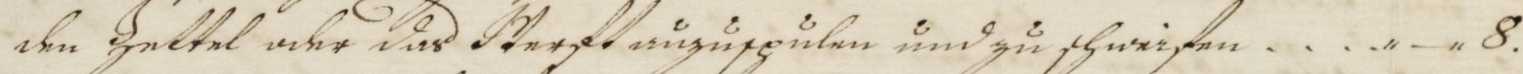den Zettel oder das Werft anzuspulen und zu schweifen.... - 8.
